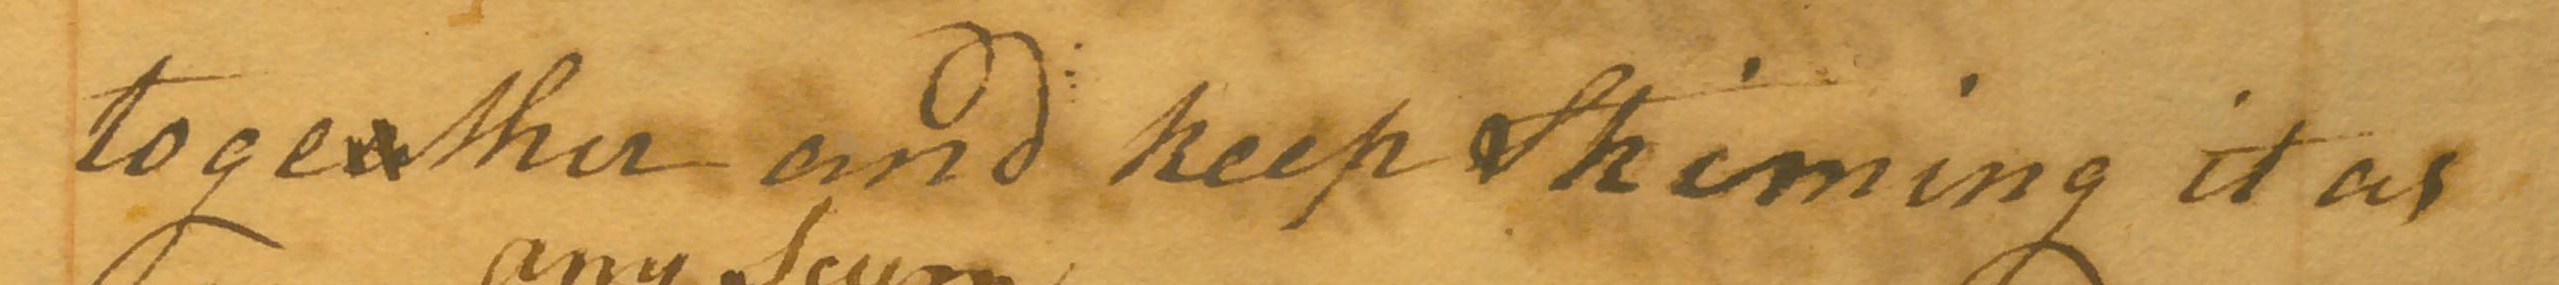togethre and keep skiming it as
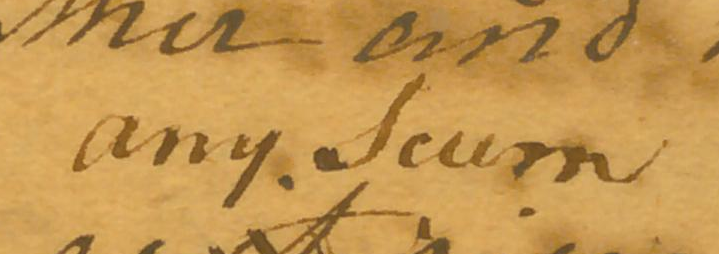any scum
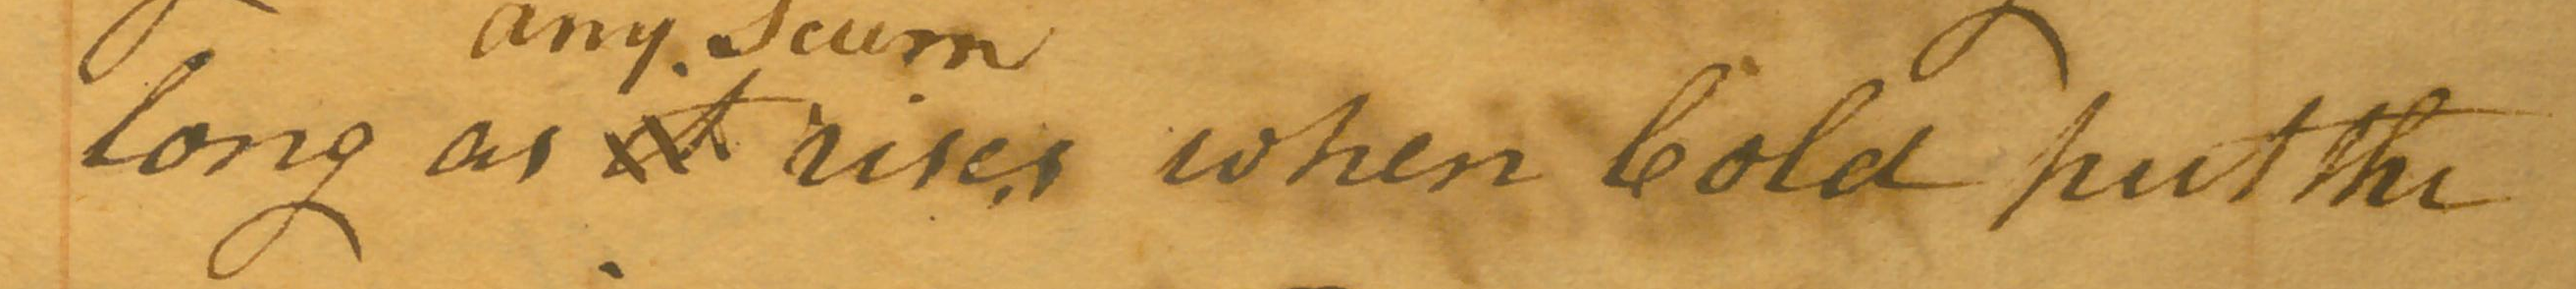long as [__] rises when Cold put the
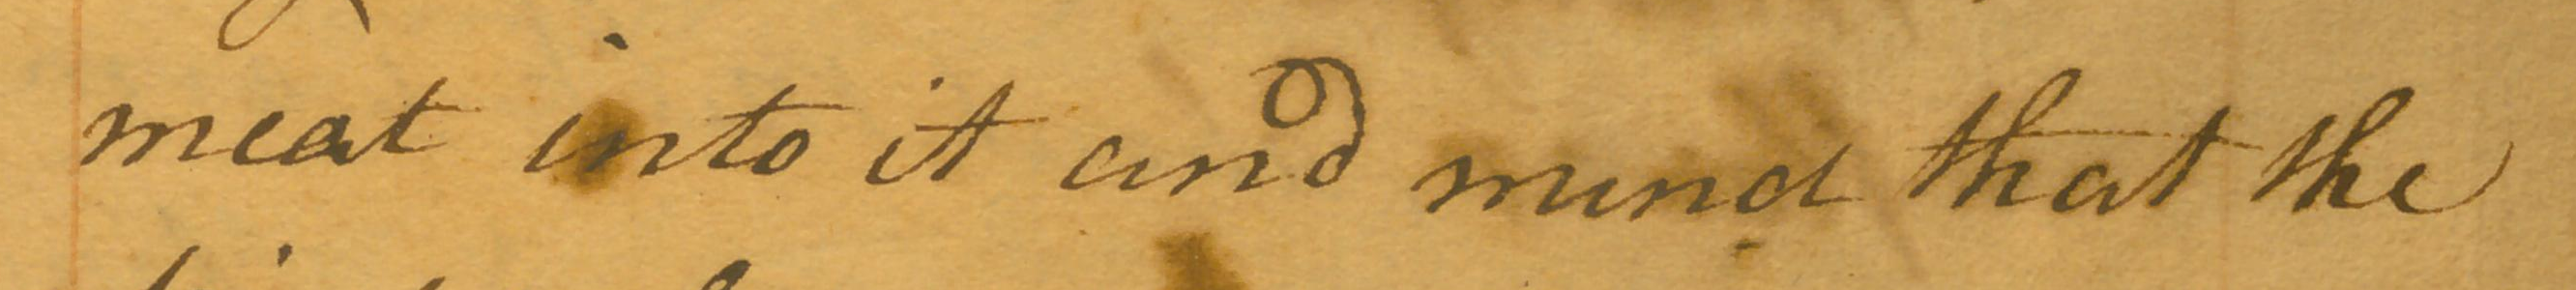meat into it and mind that the
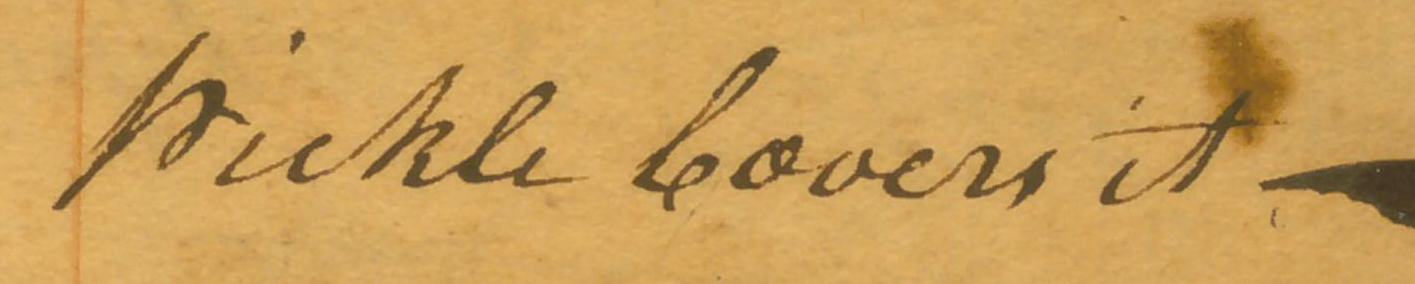pickle Covers it
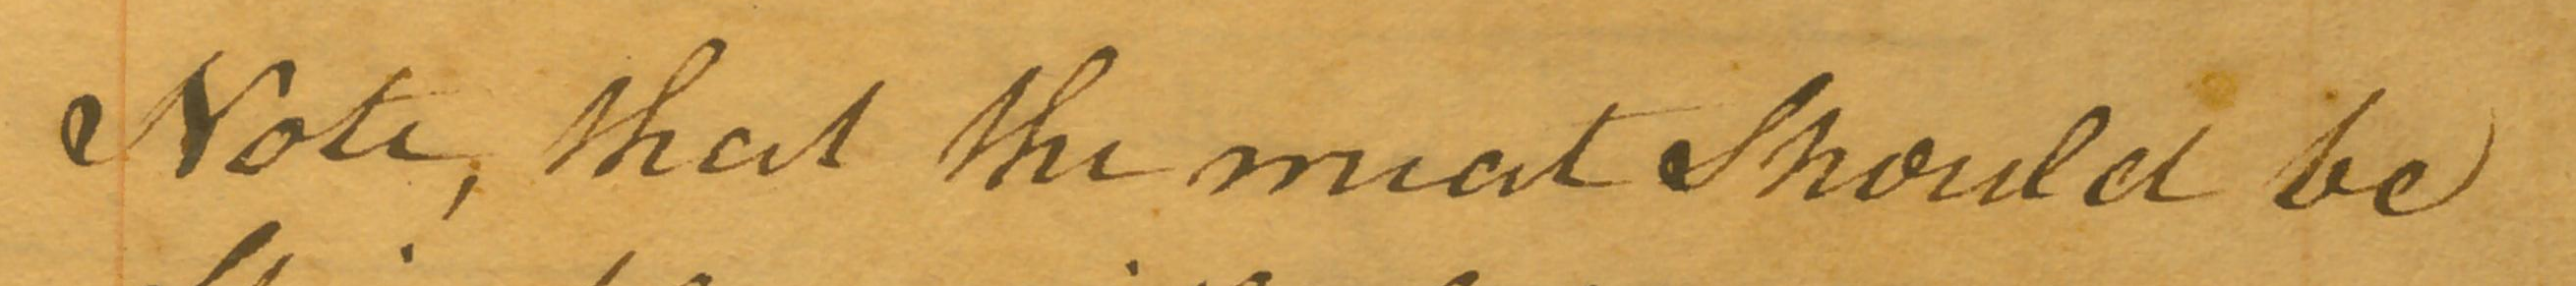Note, that the meat should be
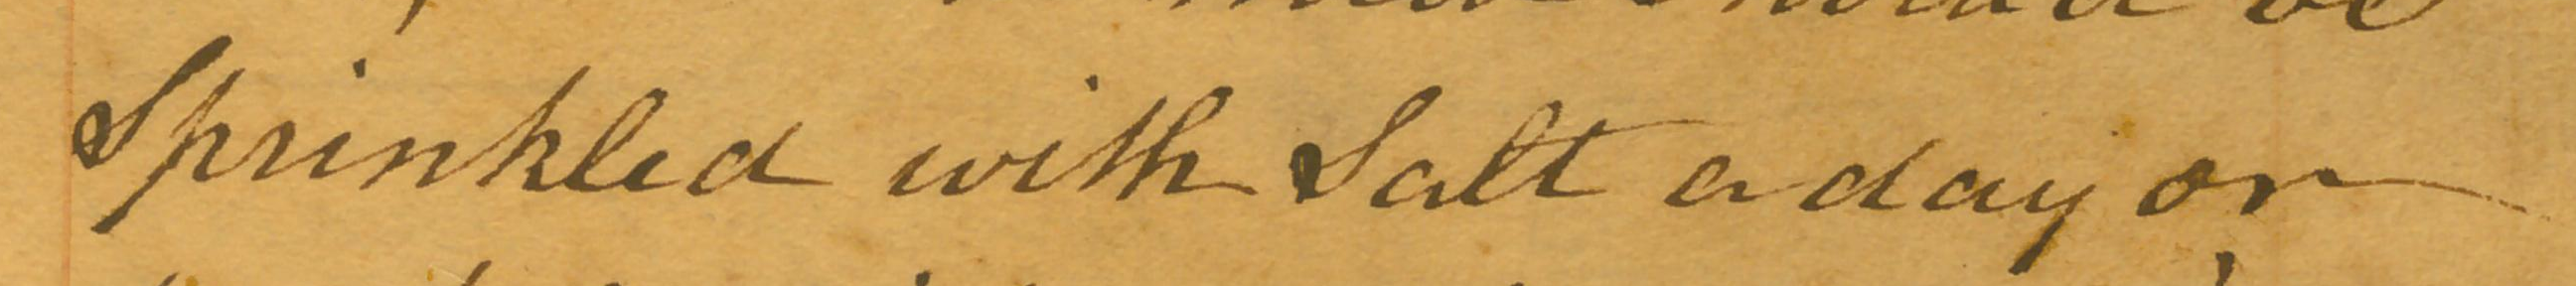sprinkled with salt a day or
